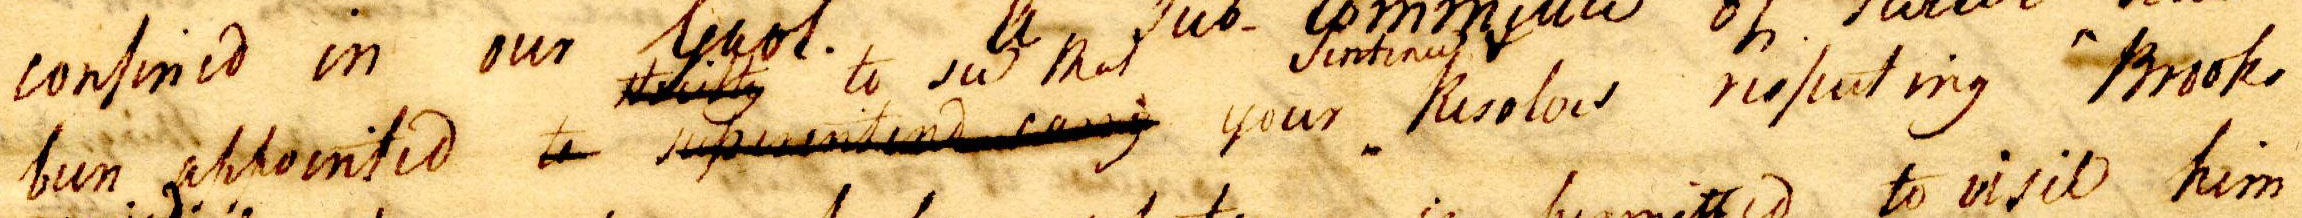been appointed to [superintend] [___] your ^ Resolves respecting Brooks
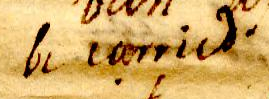be carried.
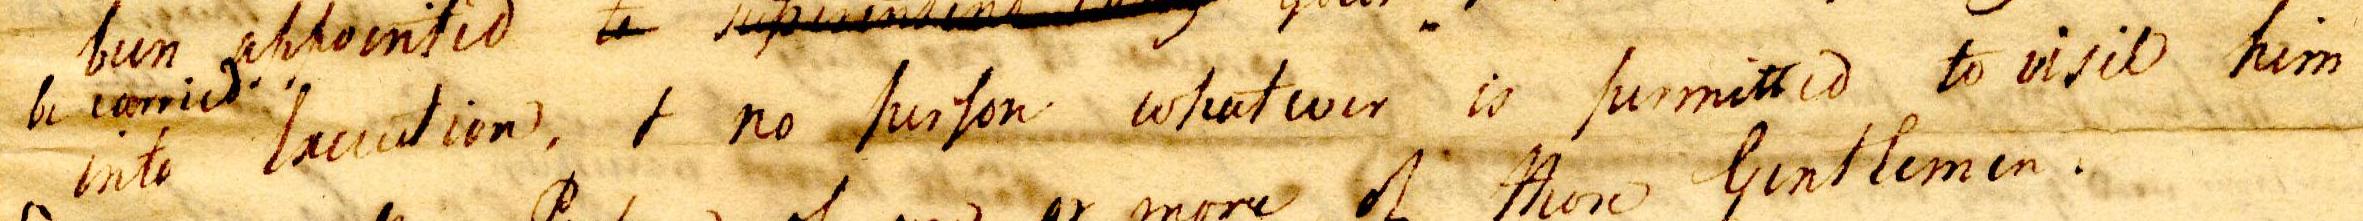^ into Execution, & no person whatever is permitted to visit him
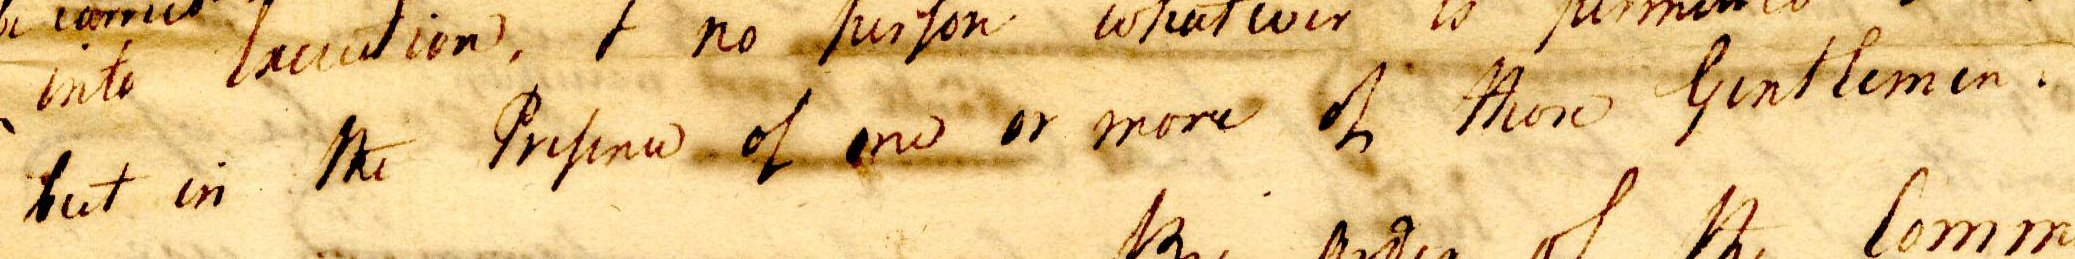but in the Presence of one or more of these Gentlemen.
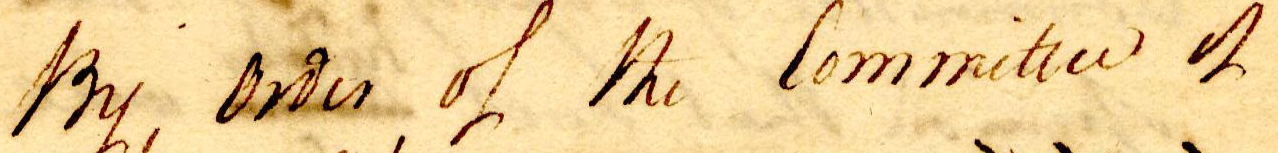By Order of the Committee of
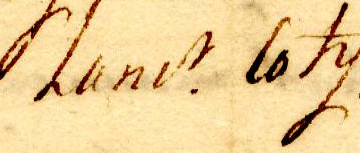Lanc^r. Coty.
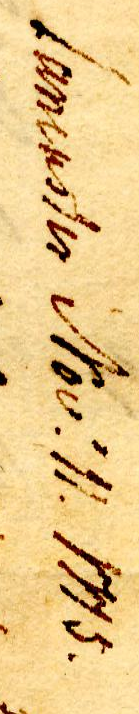Lancaster Nov^r. 11. 1775.
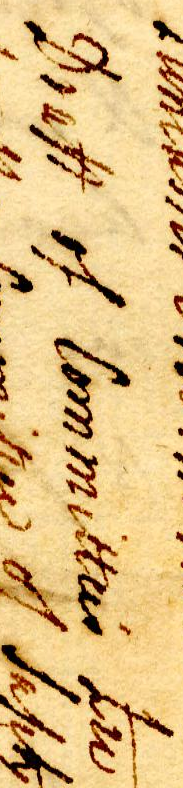Draft of Committee's Let
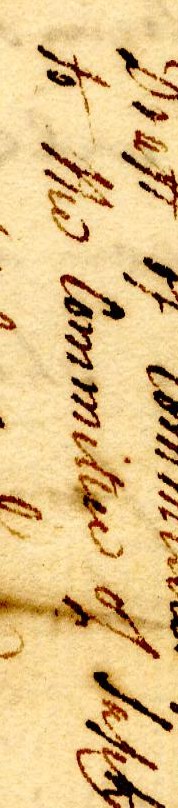to the Committee of Safety
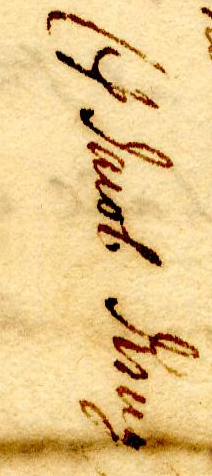(Per Jacob Krug)
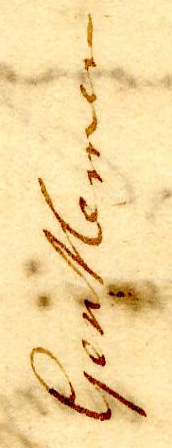Gentlemen
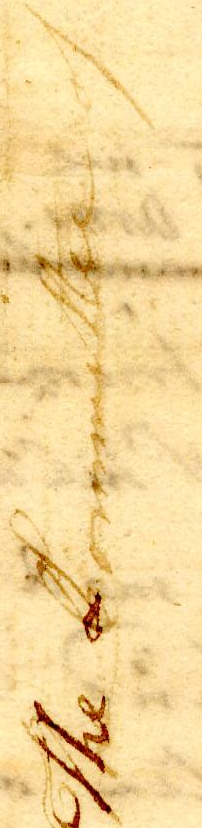The Committee of
